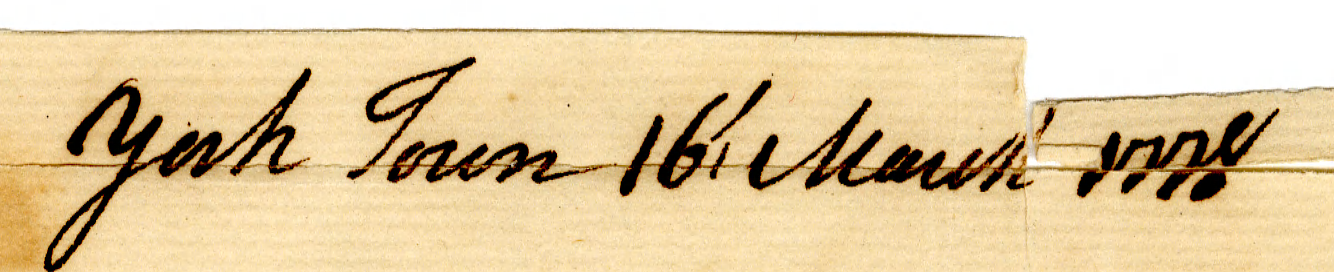York Town 16t March 1778
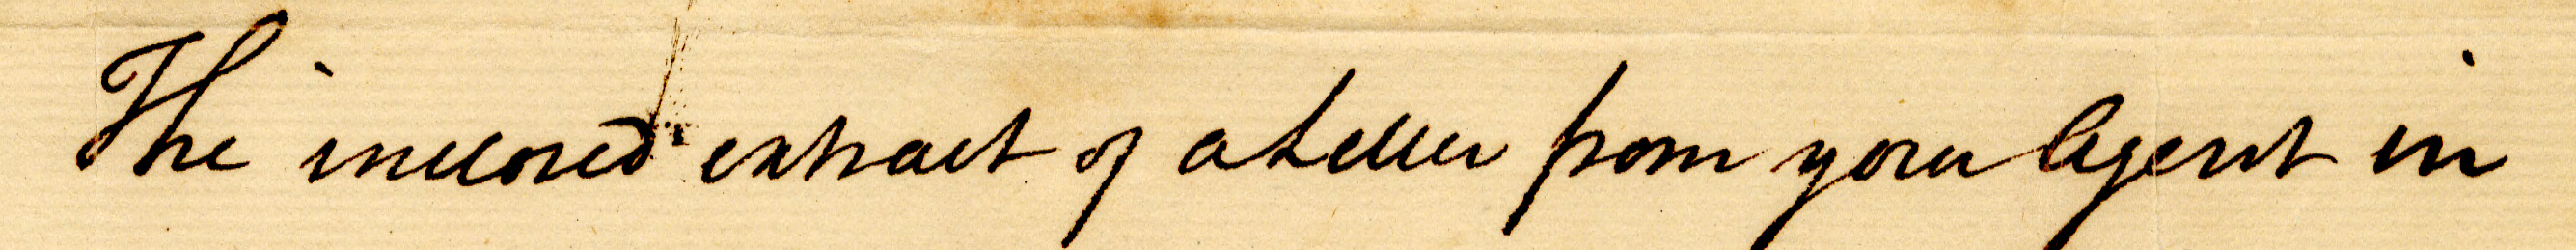The inclosed extract of a Letter from your Agent in
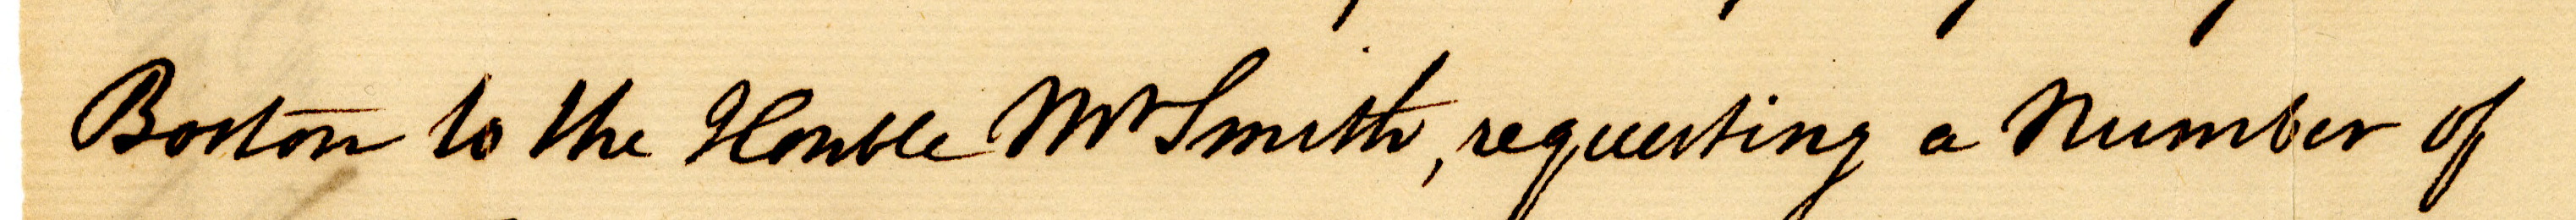Boston to the Humble M^r Smith, requesting a number of
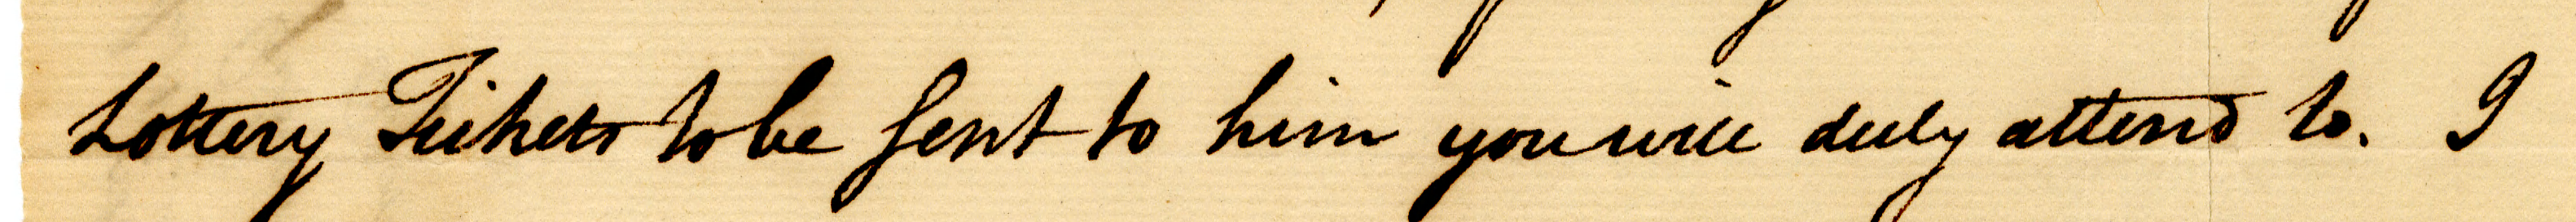Lottery Tickets to be sent to him you will duly attend to. I
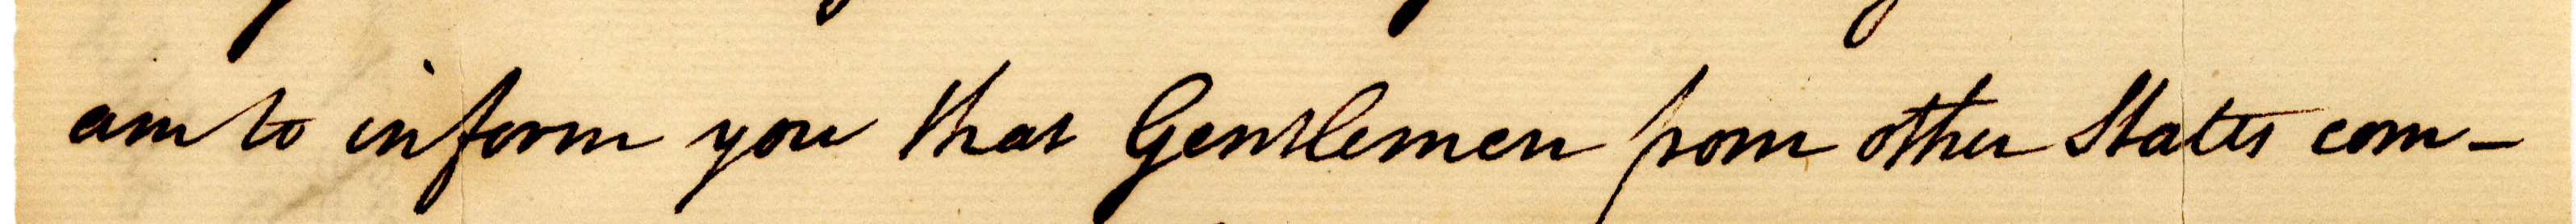am to inform you that Gentlemen from other States com-
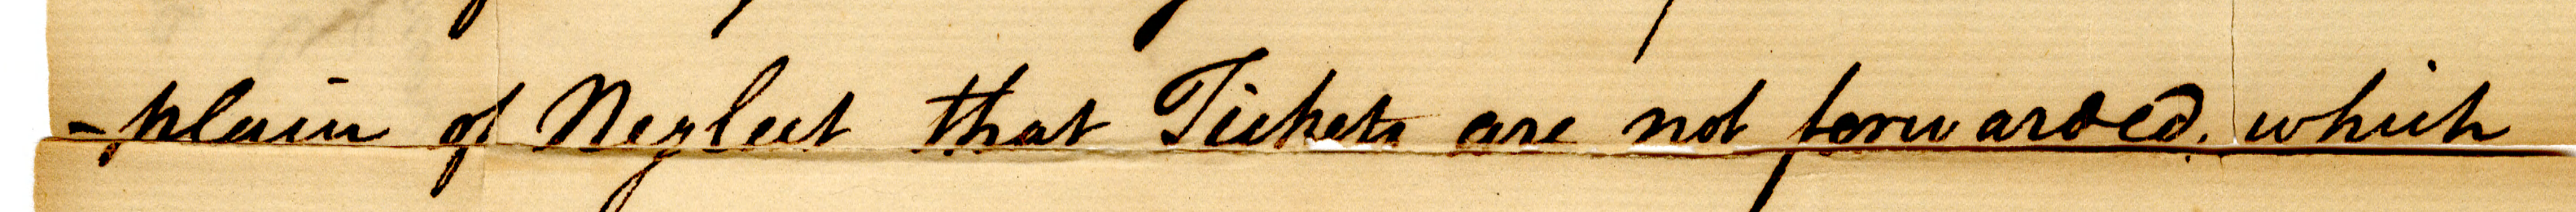-plain of neglect that Tickets are not forwarded which
